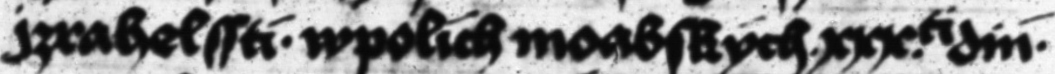izrahelſſtí. wpolích moabſkých xxxtidṅí.
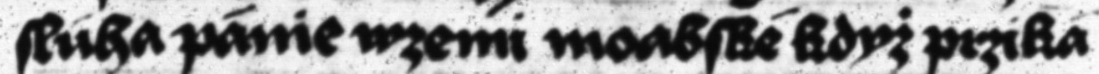ſlúha pánie wzemi moabſké kdyż przika
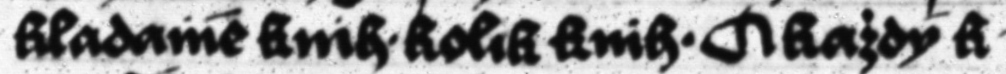kladaṅíe knih. kolik knih. A każdý k
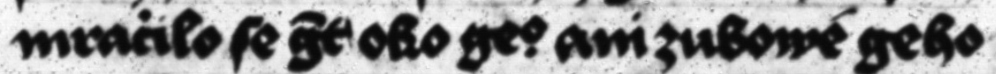mraċilo se ḡt oko ge° ani zubowé geho
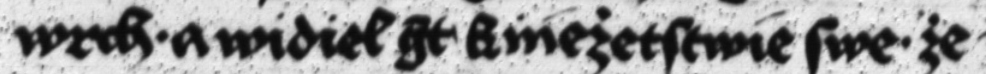wrch. a widiel ḡt kṅíeżetſtwíe ſwe. że
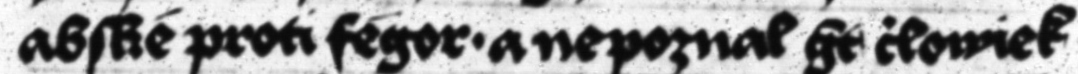abſké proti fégor. a nepoznal ḡt ċlowiek
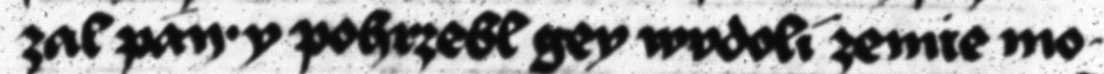zal pán. y pohrzebl gey wvdolí zemie mo
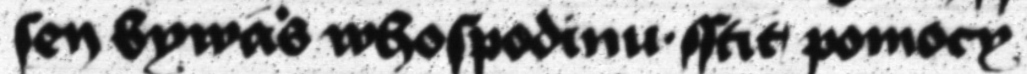ſen bywáṡ whoſpodinu. ſſtít pomocy
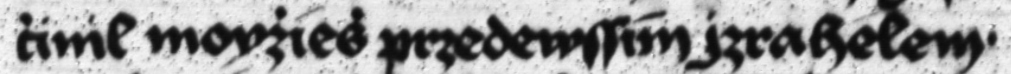ċinil moyžíeṡ przedewſſím izrahelem.
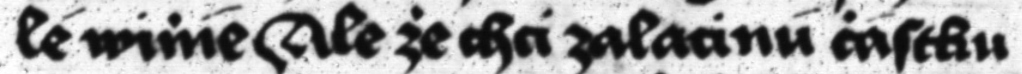lé wiṅíe Ale że chti zalacinú ċáſtku
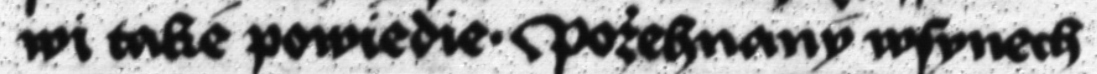wi také powiedie. Pożehnaný wſynech
